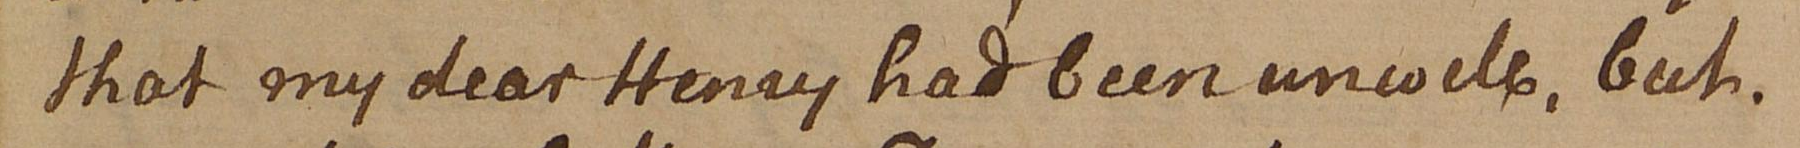that my dear Henry had been unwell, but.
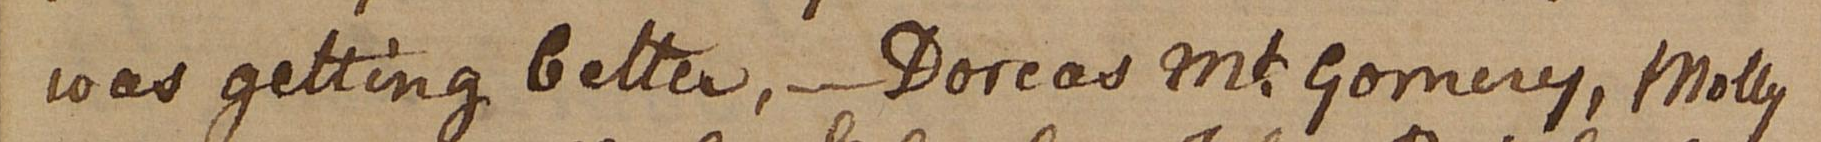was getting better,- Dorcas M^t. Gomery, Molly
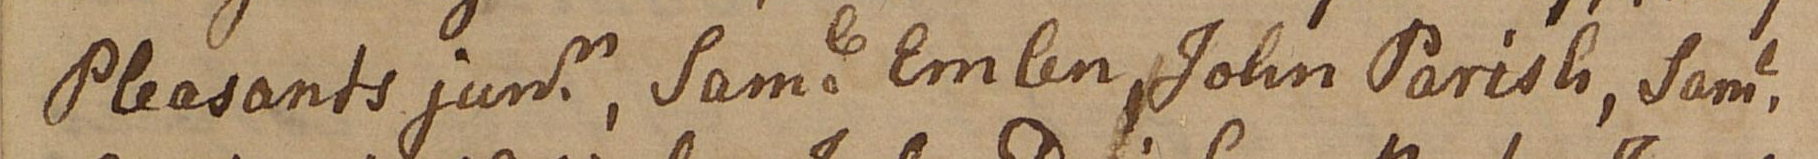Pleasants jun^r., Sam^l. Emlen, John Parish, Sam^l.
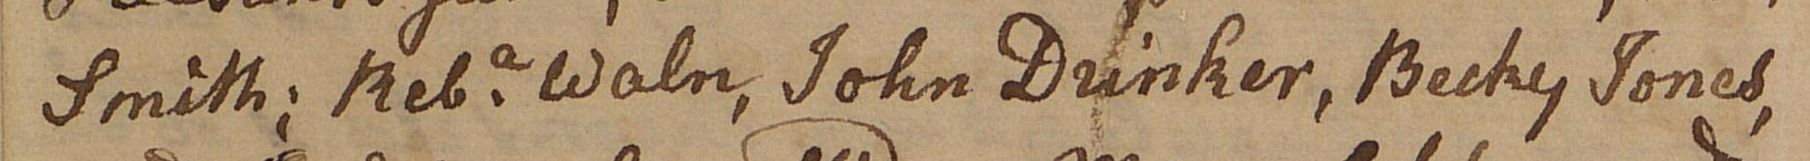Smith; Reb^a. Waln, John Drinker, Becky Jones,
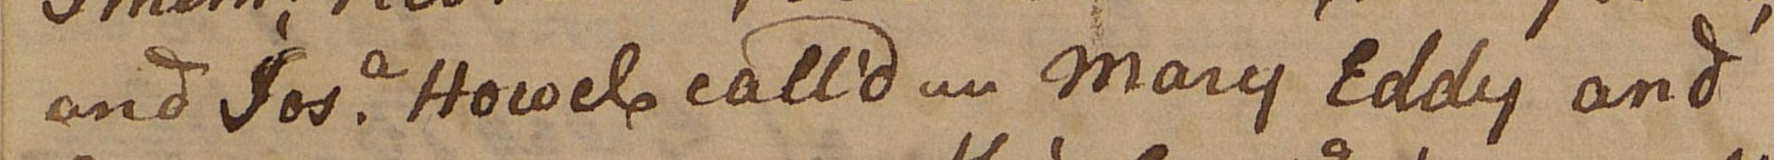and Jos^a. Howel call'd us Mary Eddy and
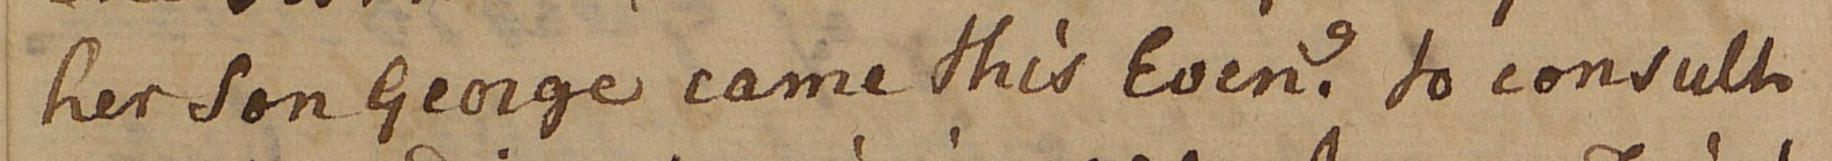her son George came this Even^g. to consult
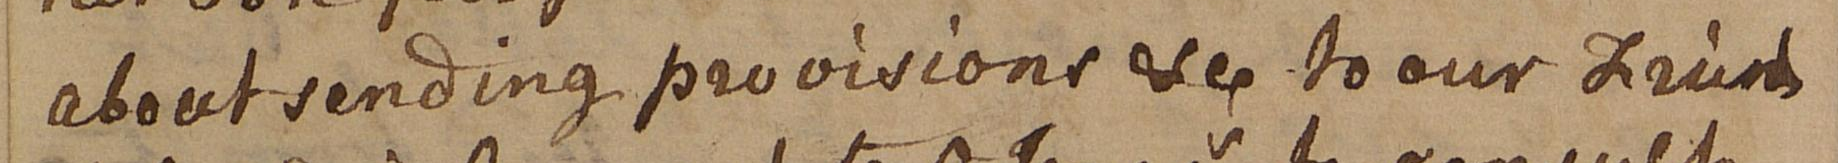about sending provisions &c to our Friend
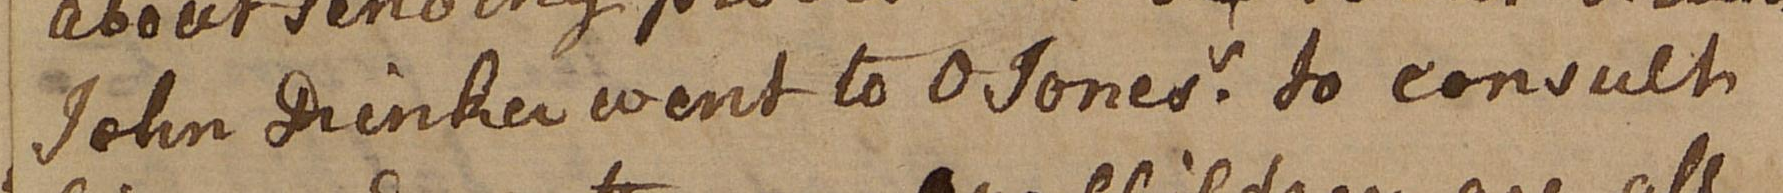John Drinker went to O Jones^s. to consult
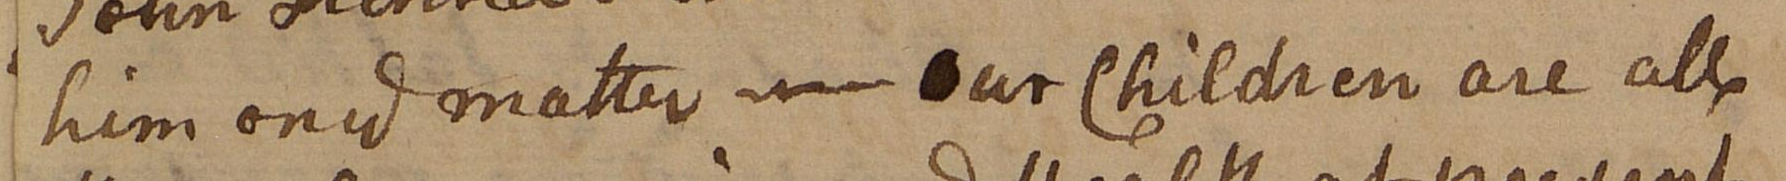him on y^e matter- Our Children are all
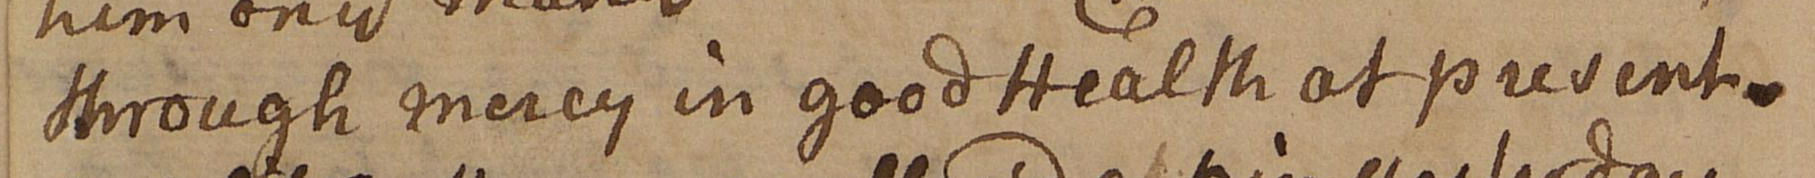through mercy in good Health at present.
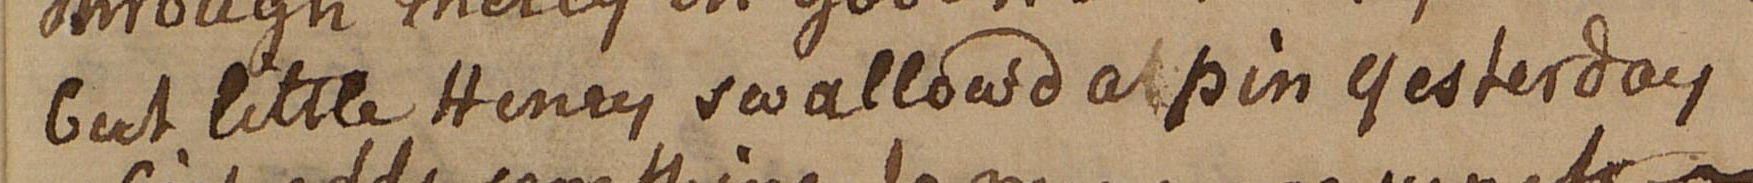but little Henry swallow'd a pin yesterday
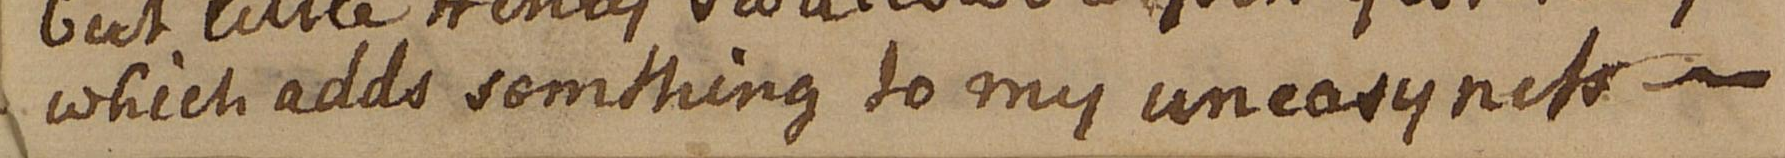which adds somthing to my uneasyness-
